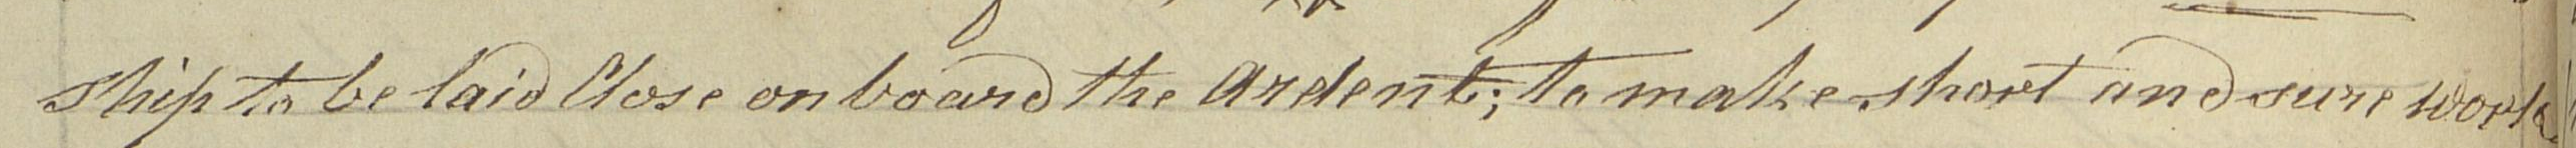ship to be laid Close on board the Ardent; to make short and sure work
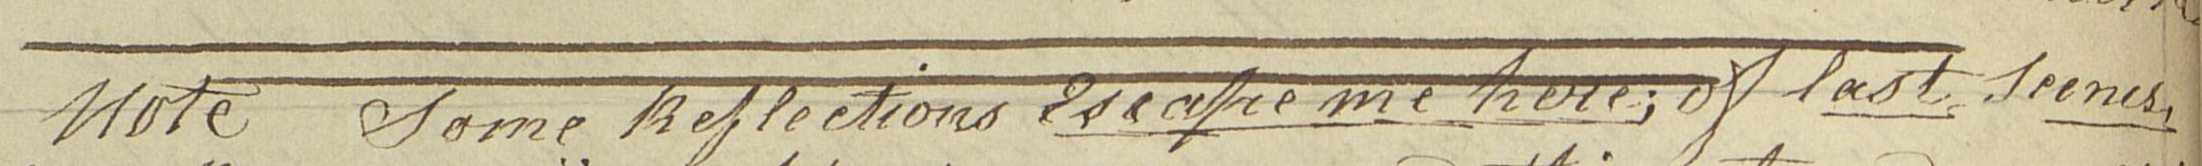Note some Reflections Escape me here; of last scenes,
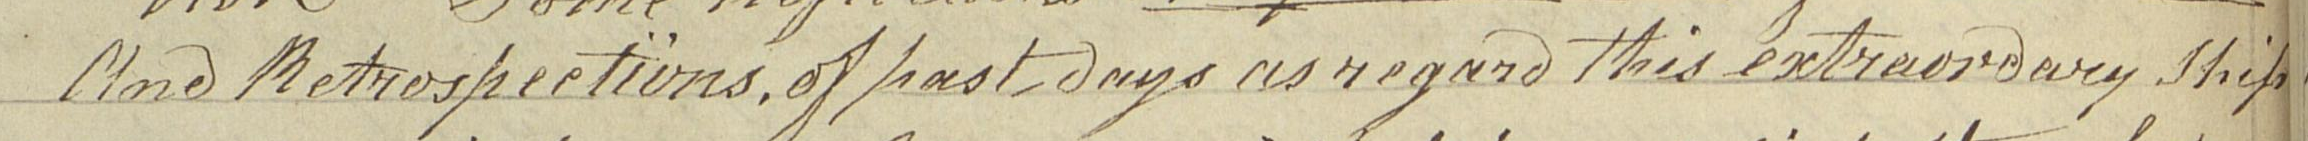And Retrospections, of past days as regard this exraordary ship
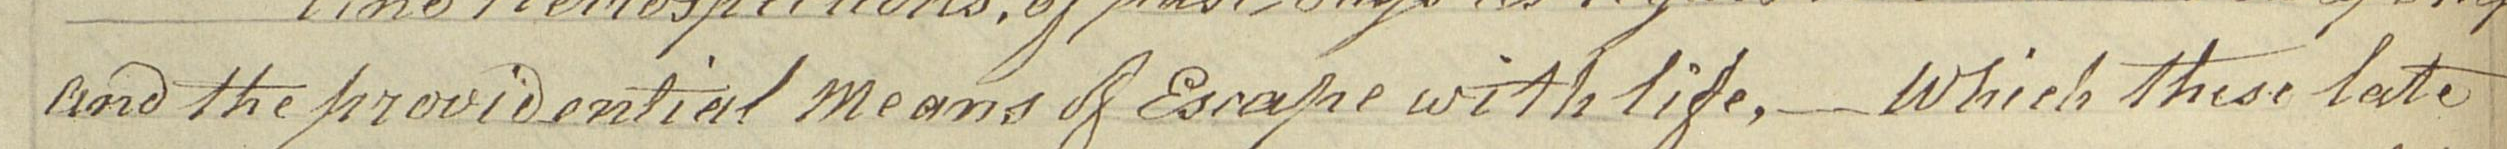and the providential means of Escape with life, which these late
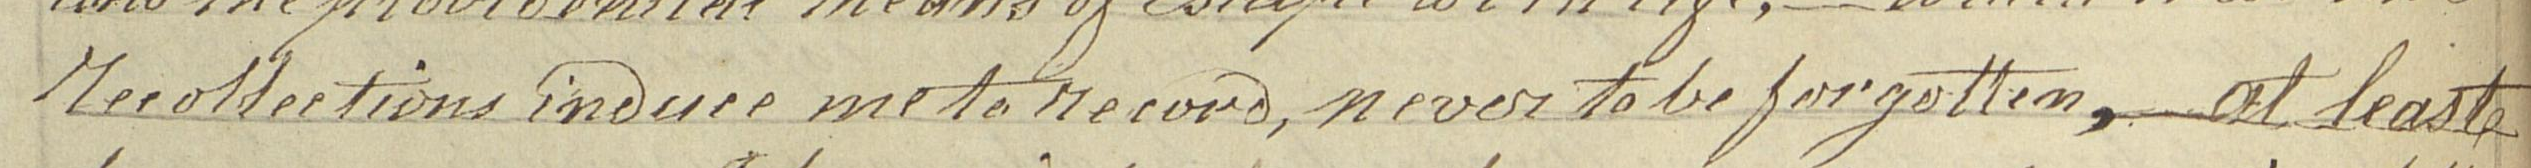Recollections induce me to record; never to be forgotten, at least
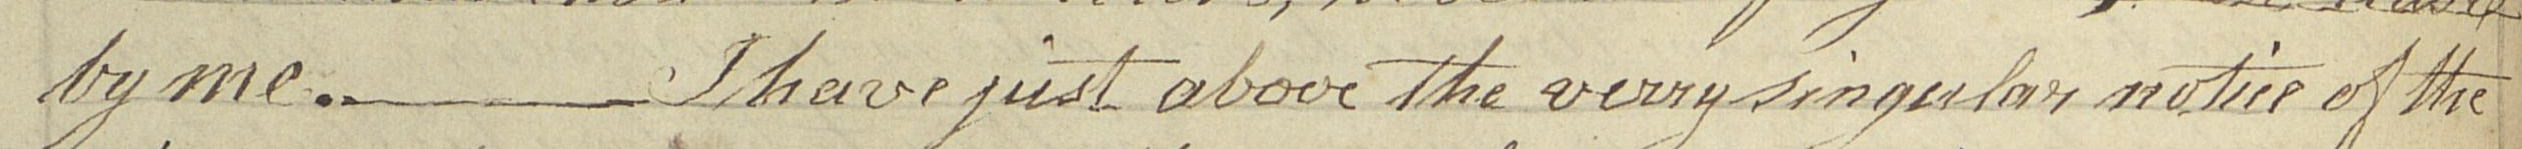by me. I have just above the verry singular notice of the
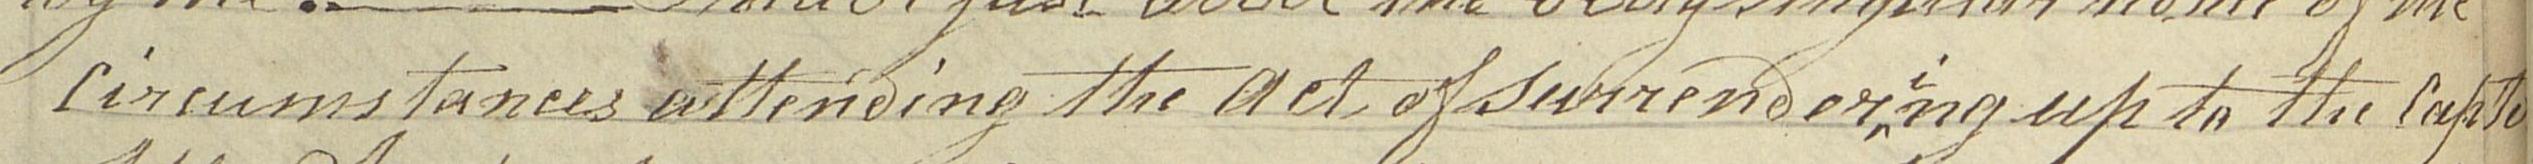Circumstances attending the Act of Surrender^ing up to the Cap-
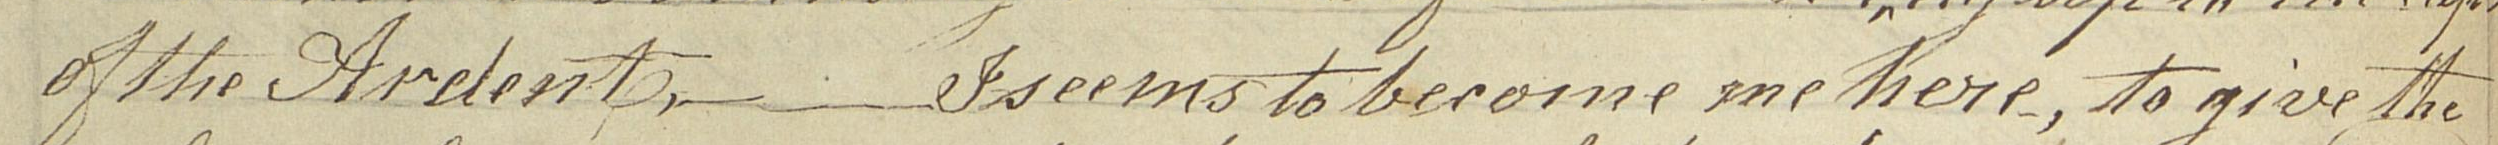of the Ardent, I seems to become me here, to give the
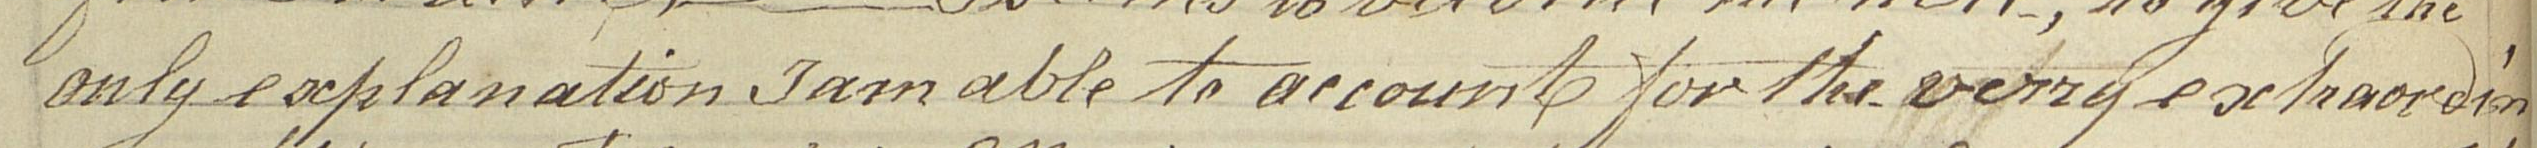only explanation I am able to account for the verry extraordin-
